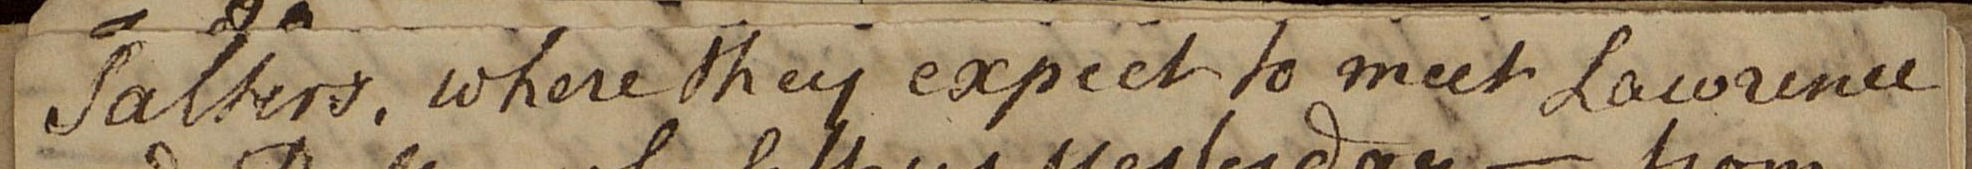Salters, where they expect to meet Lawrence
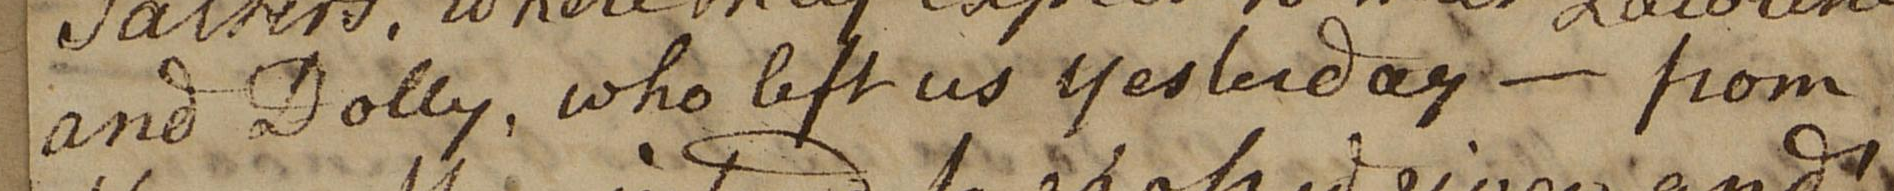and Dolly, who left us yesterday- from
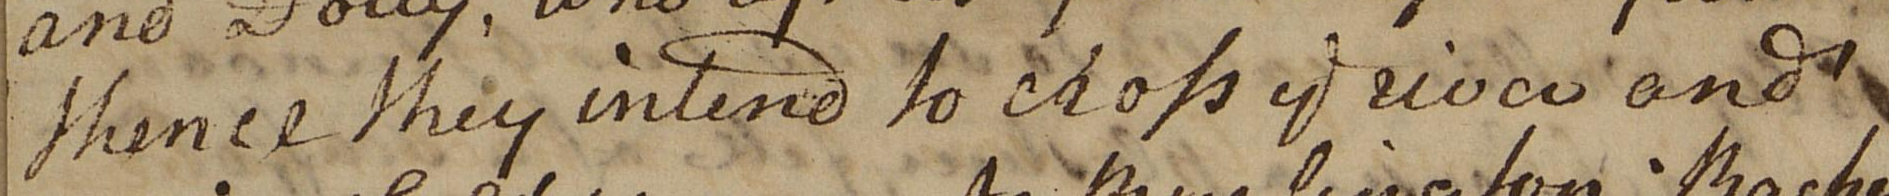thence they intend to cross y^e river and
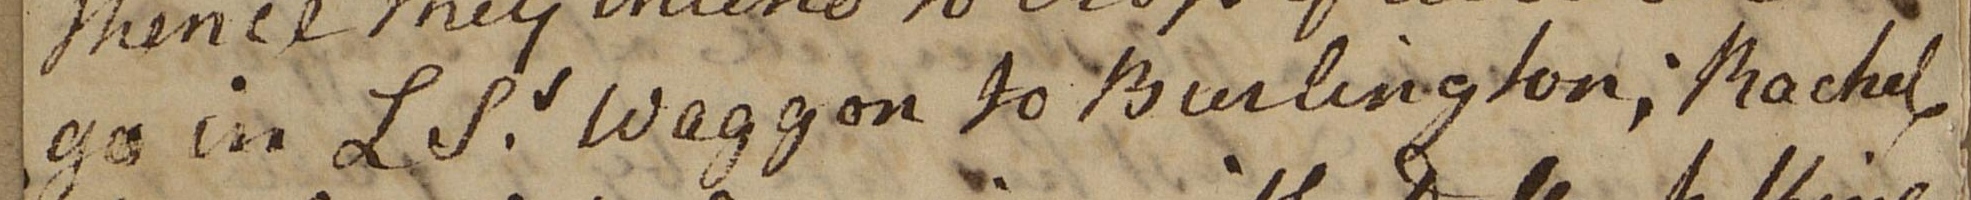go in LS^s. Waggon to Burlington; Rachel
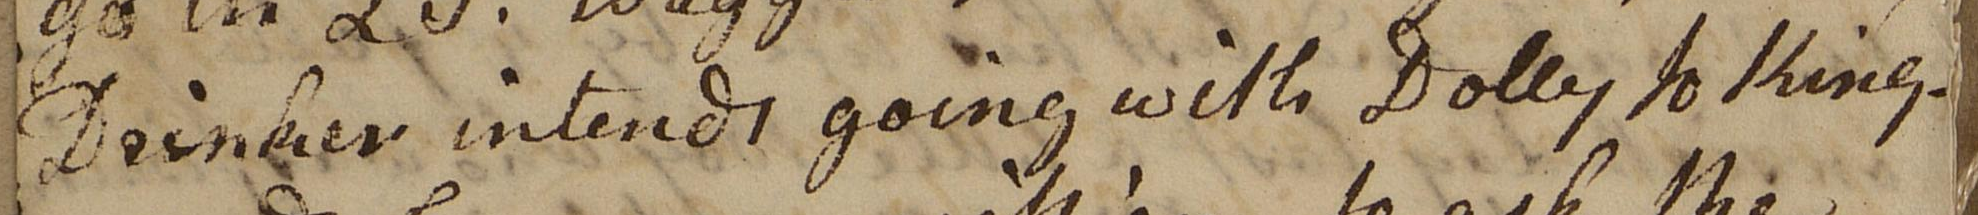Drinker intends going with Dolly to King-
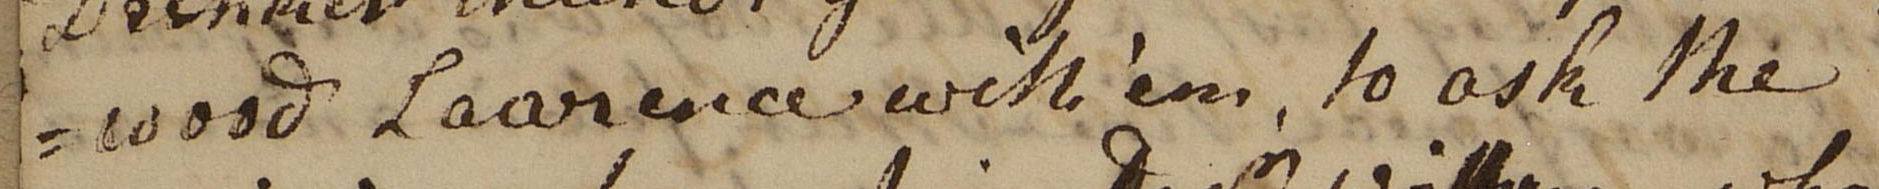-wood Lawrence with 'em, to ask the
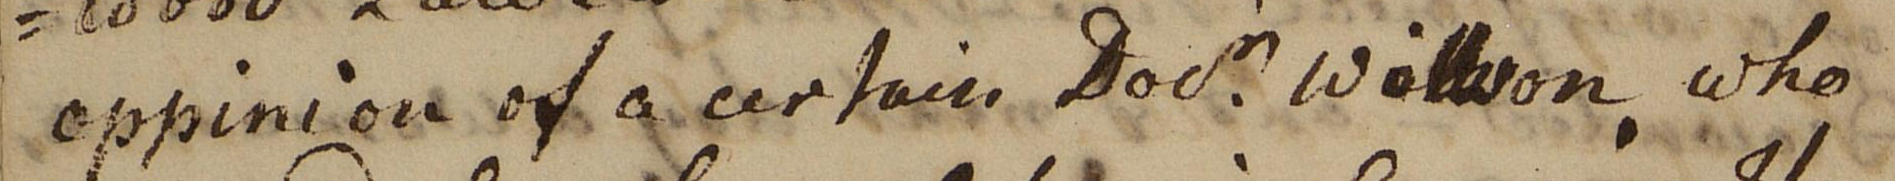oppinion of a certain Doc^r. Willson who
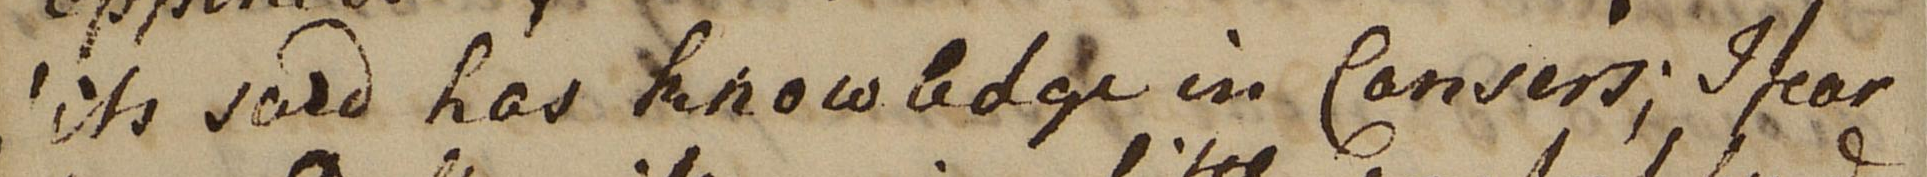its said has knowledge in Cansers; I fear
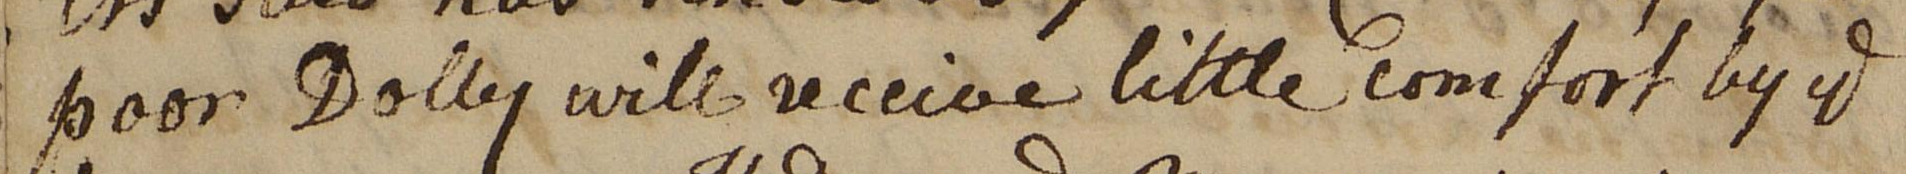poor Dolly will receive little comfort by y^e
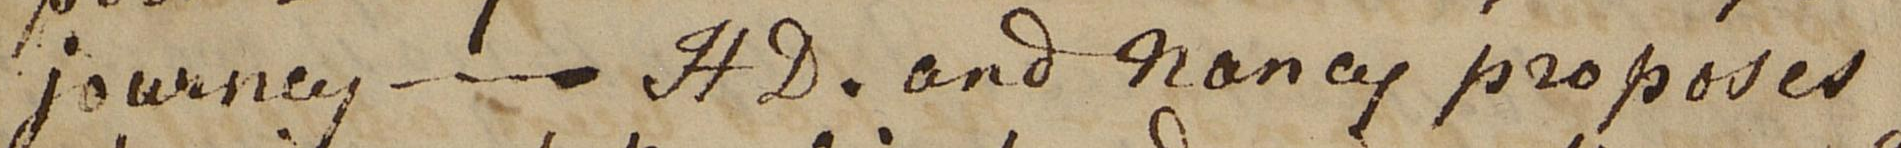journey-- HD and Nancy proposes
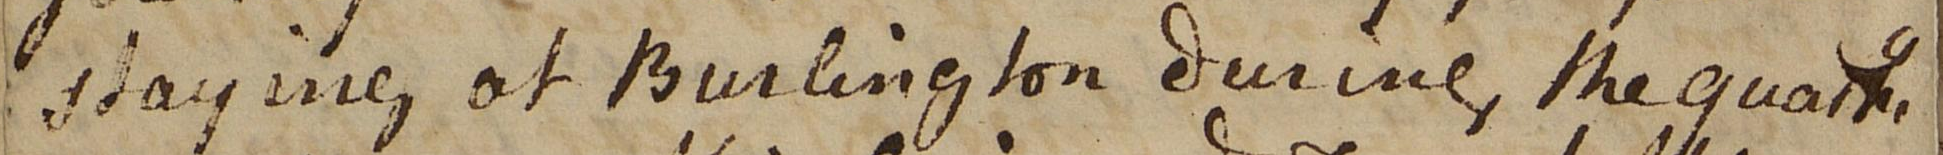staying at Burlington during, the quart^y.
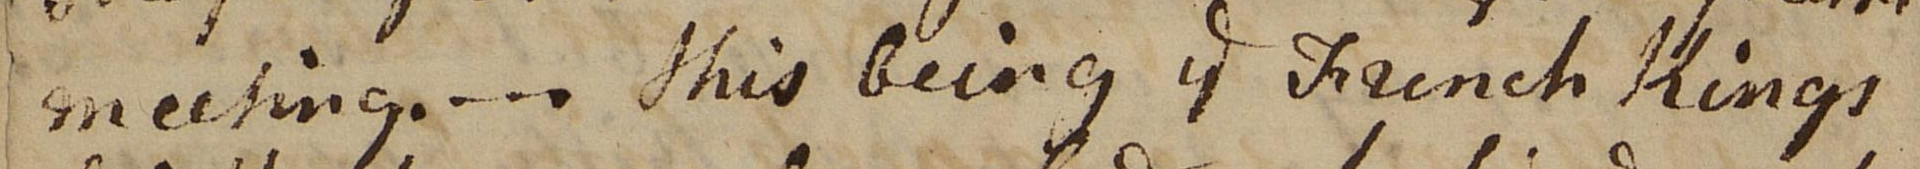meeting.- This being y^e French Kings
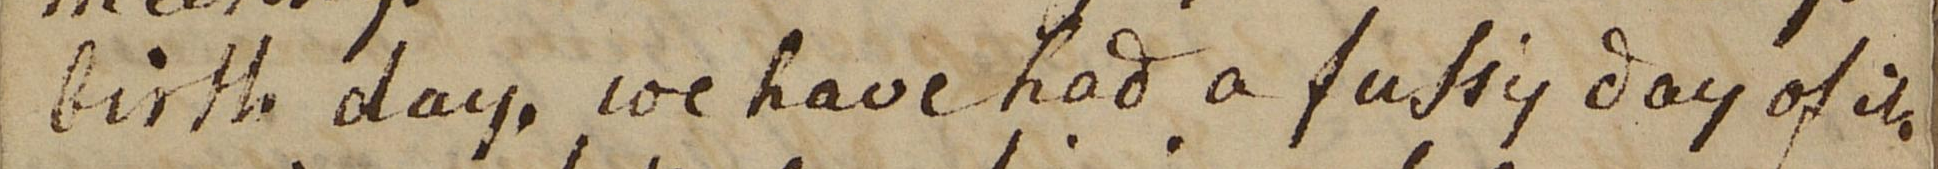birth day, we have had a fussy day of it
